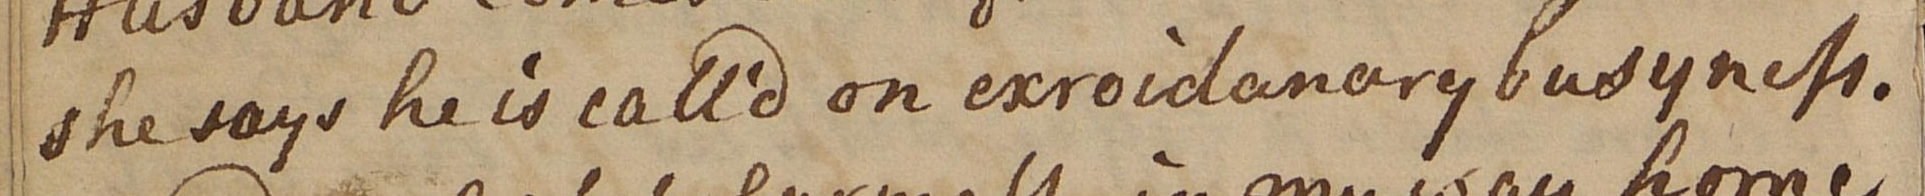she says he is call'd on exroidanary busyness.
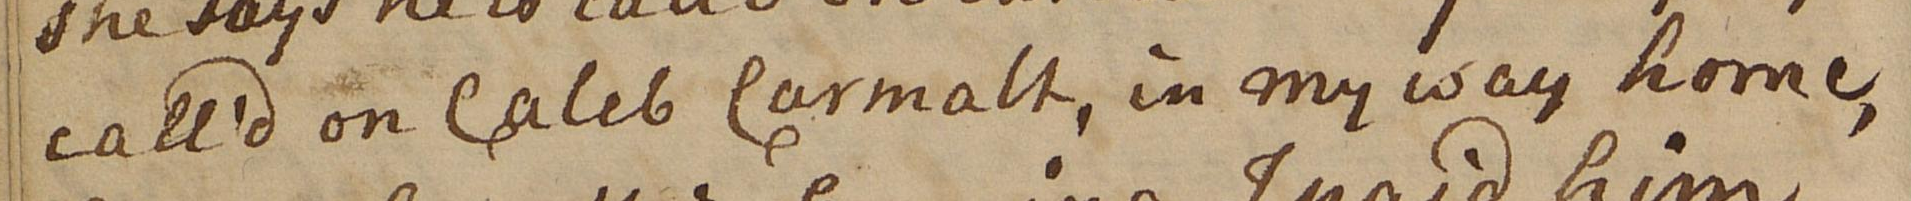call'd on Caleb Carmalt, in my way home,
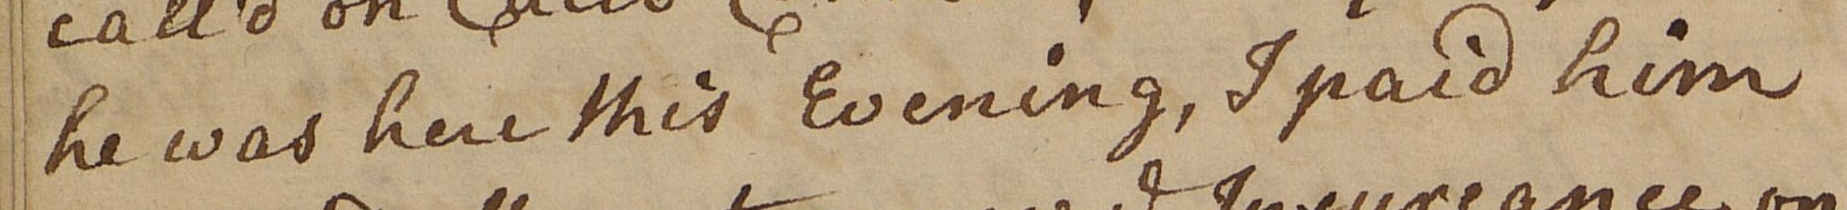he was here this Evening, I paid him
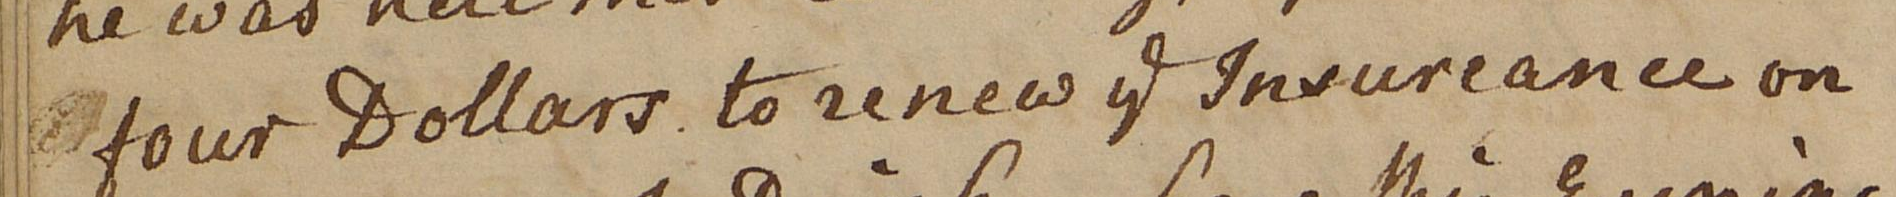four Dollars to renew y^e Insureance on
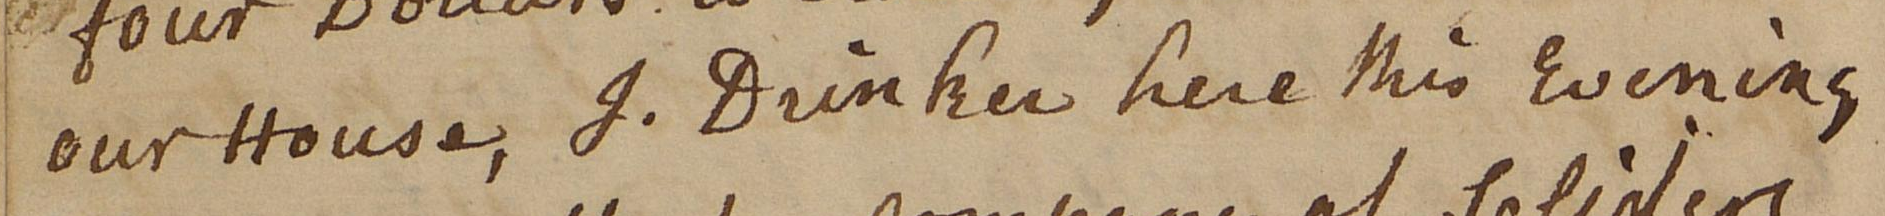our House, J. Drinker here this Evening
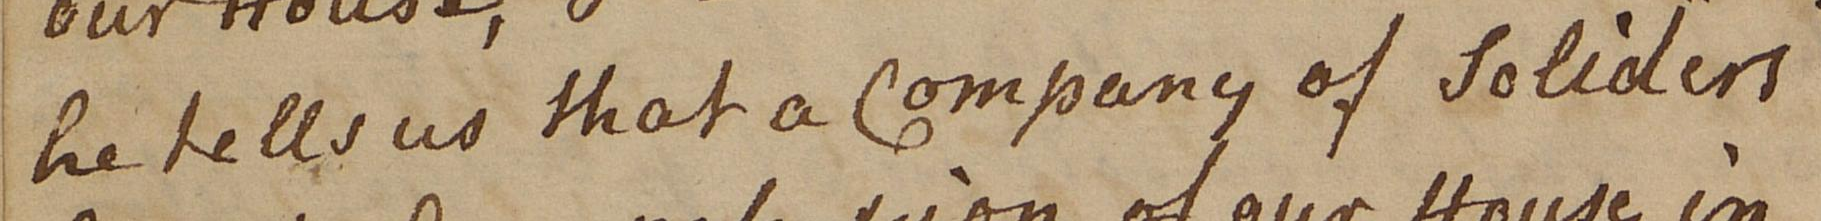he tells us that a Company of Soliders
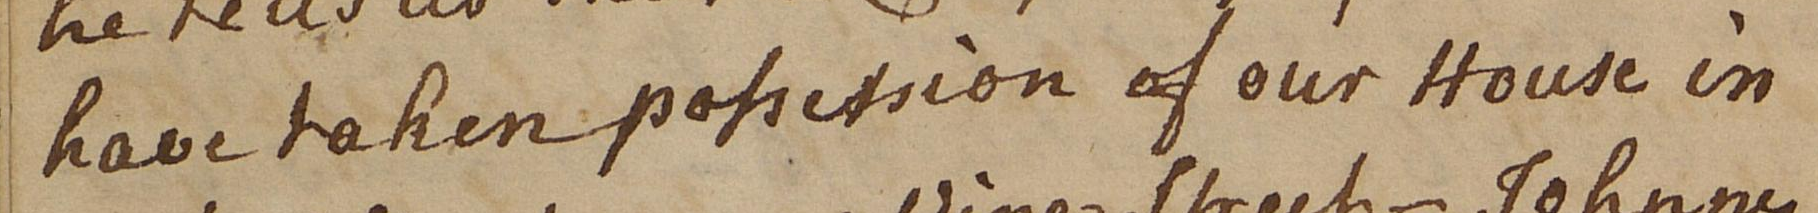have taken possession of our House in
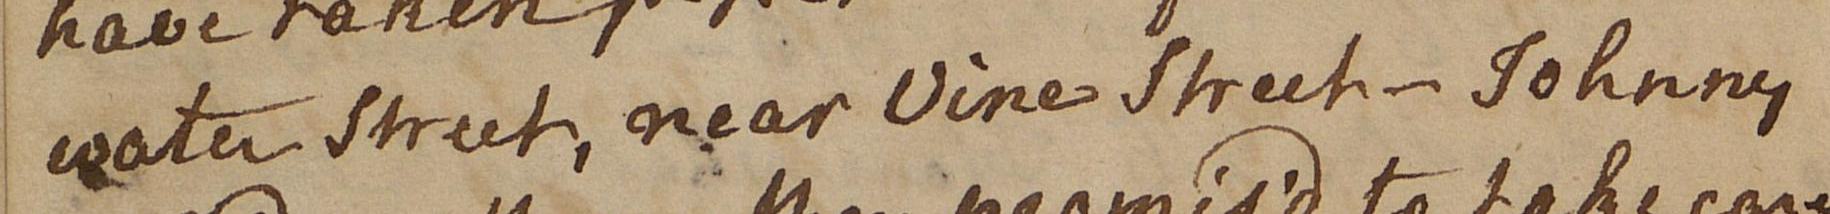water Street, near Vine Street- Johnny
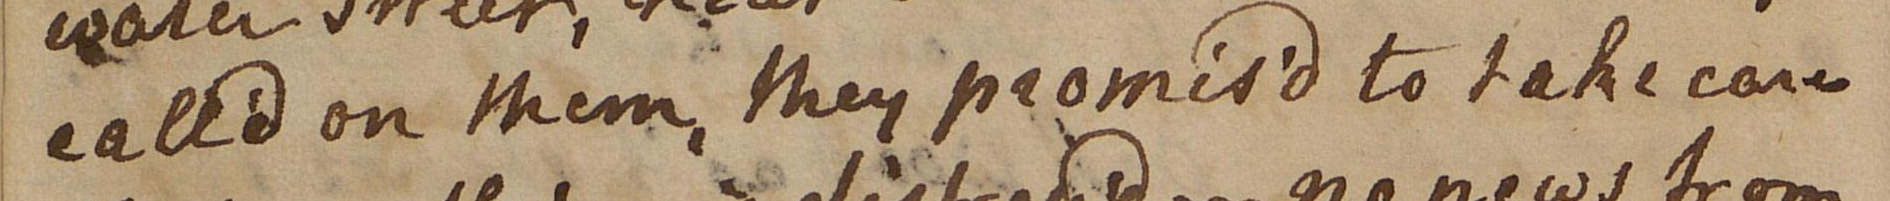call'd on them, they promis'd to take care
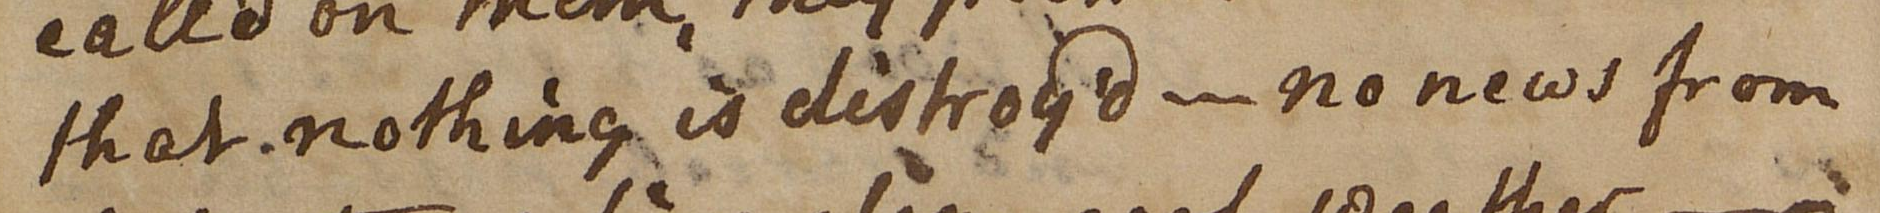that nothing is distroy'd- no news from
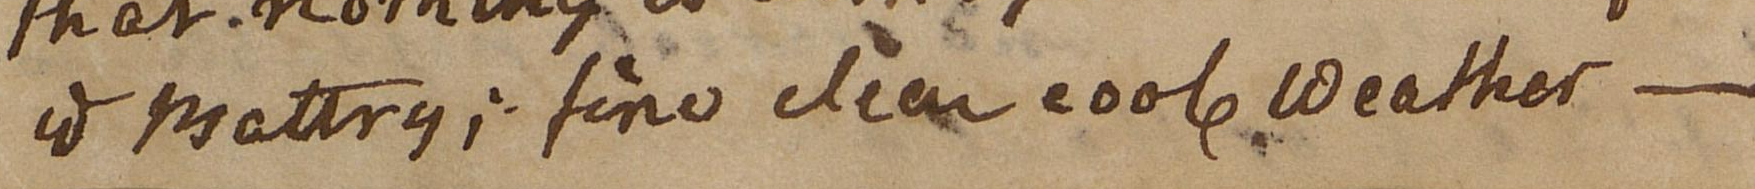y^e Battry; fine clear cool weather-
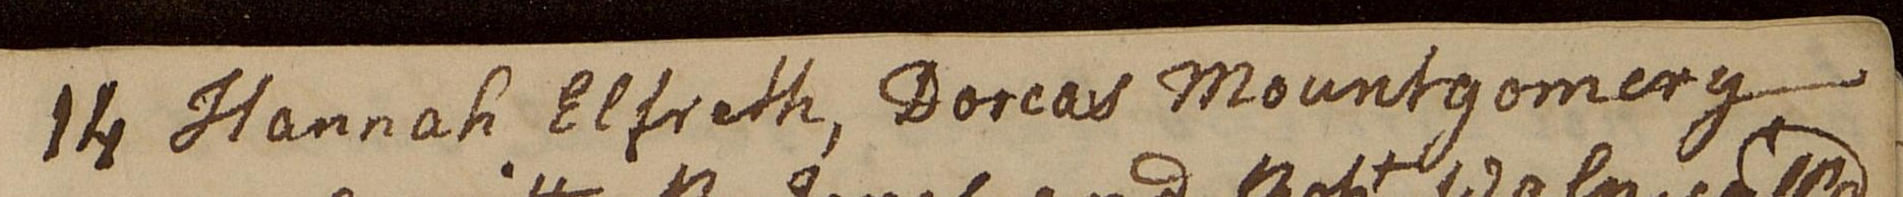14 Hannah Elfreth, Doreas Mountgomery-
